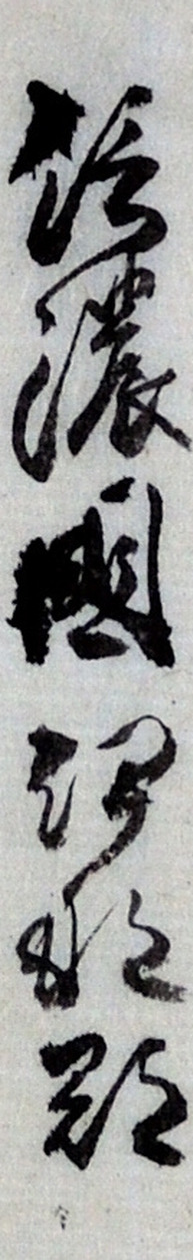信濃国伊那郡
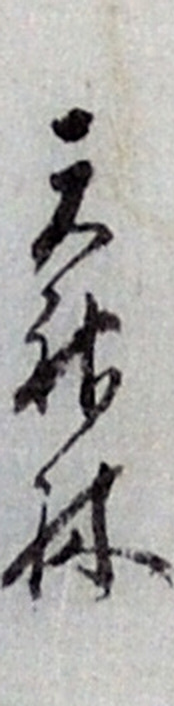天神林
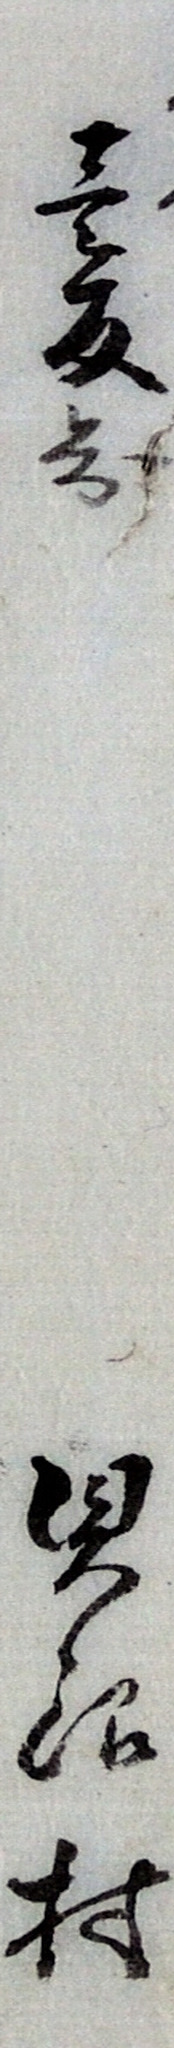一壱反歩貝沼村
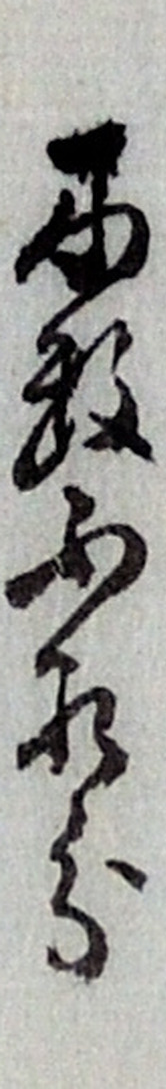木数不相分
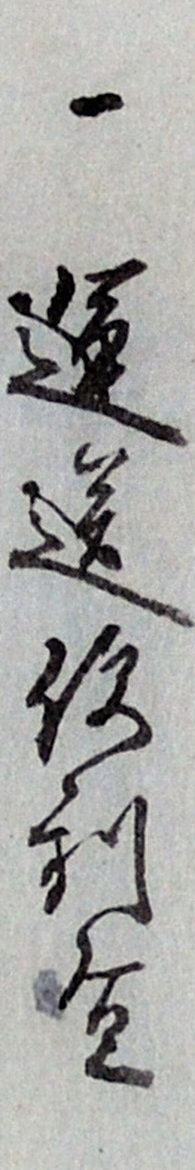一運送便利宜
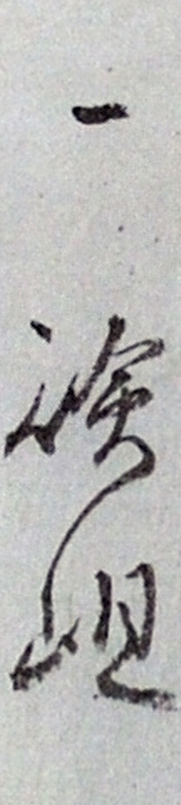一嶮岨

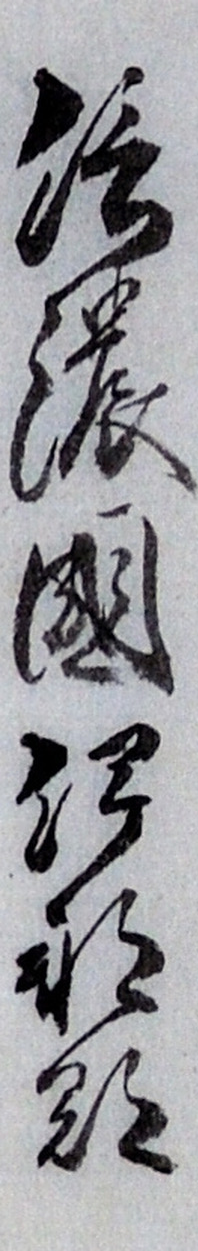信濃国伊那郡
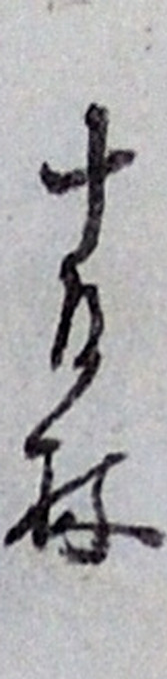十日林
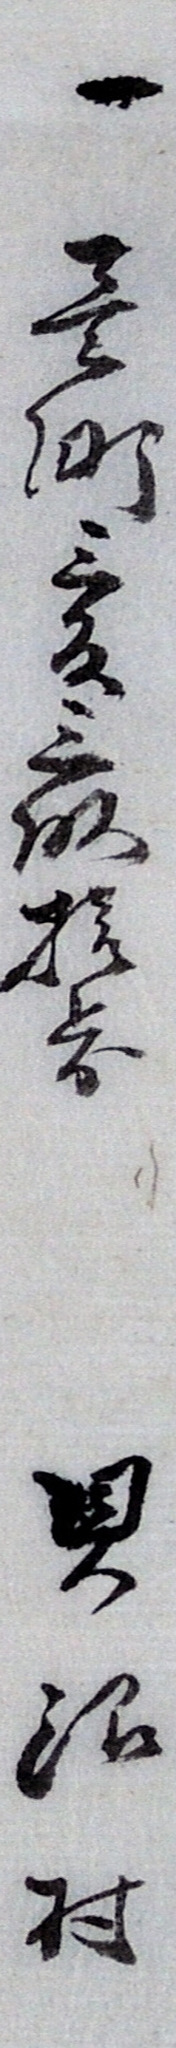一壱町三反三㽗拾歩貝沼村
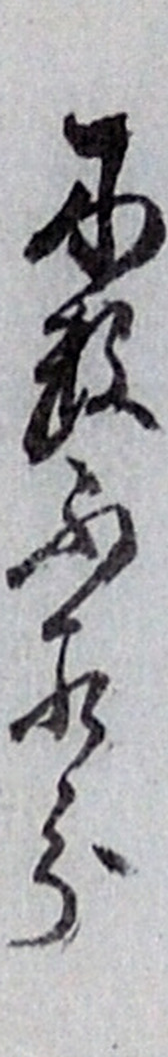木数不相分
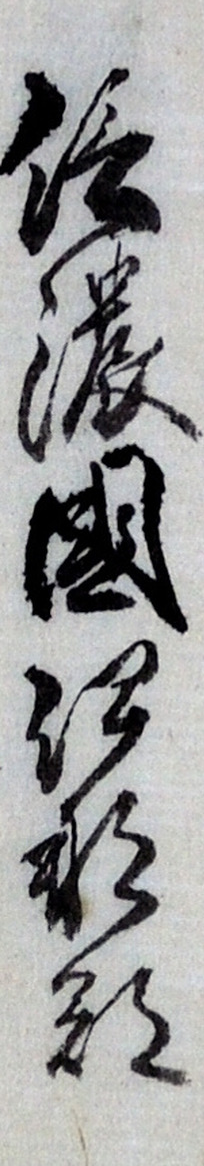信濃国伊那郡
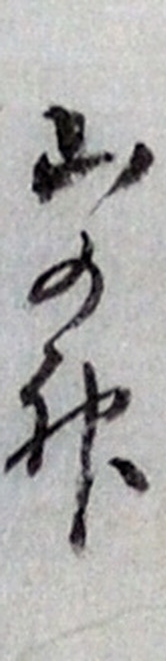山の神
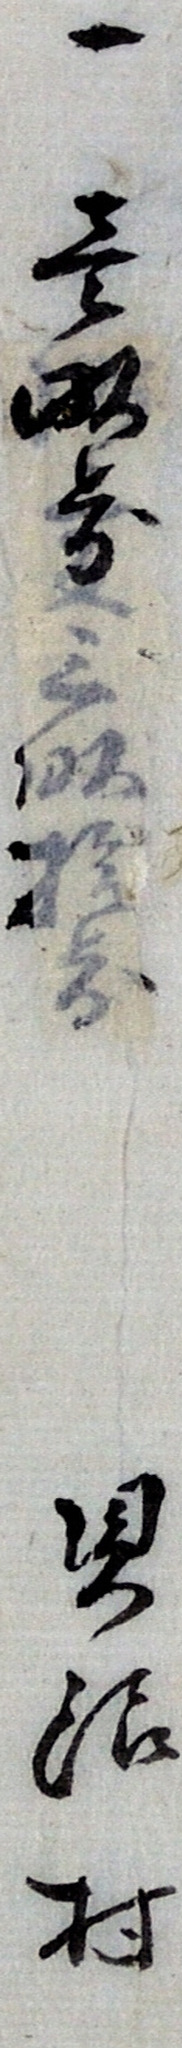一壱㽗歩貝沼村
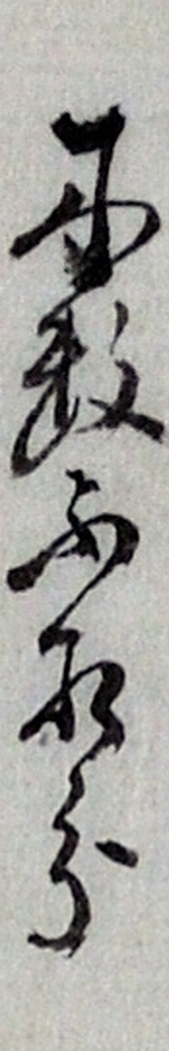木数不相分
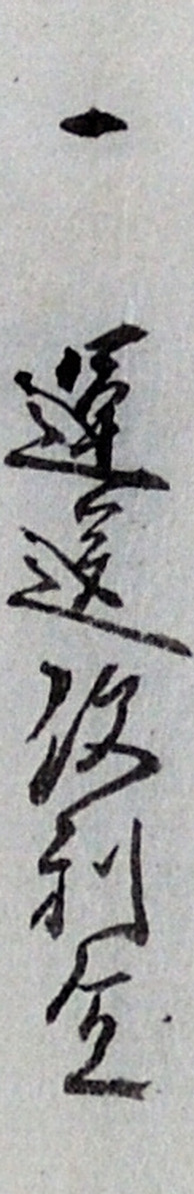一運送便利宜
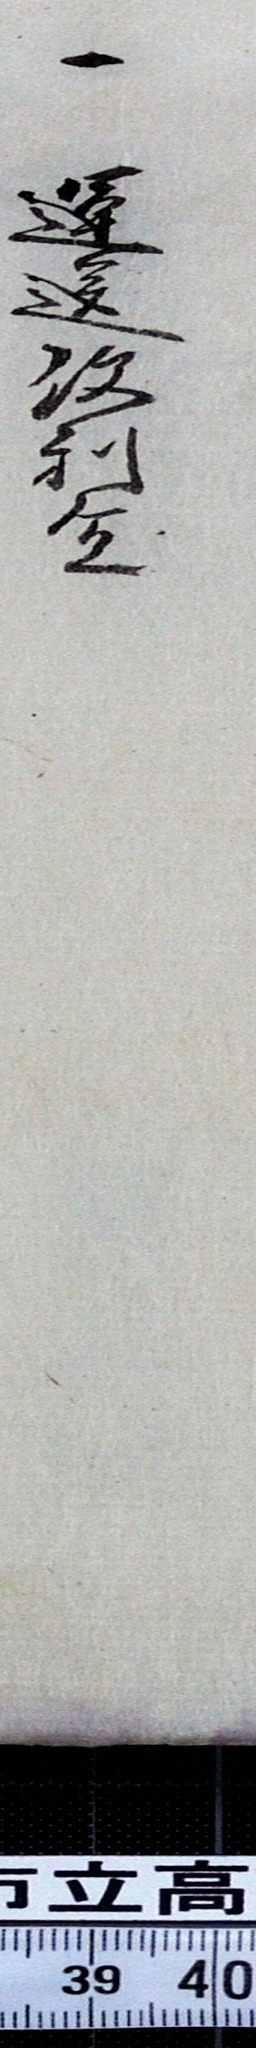一運送便利宜
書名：官林反別帳
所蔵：伊那市立高遠町図書館・合同会社AMANE
